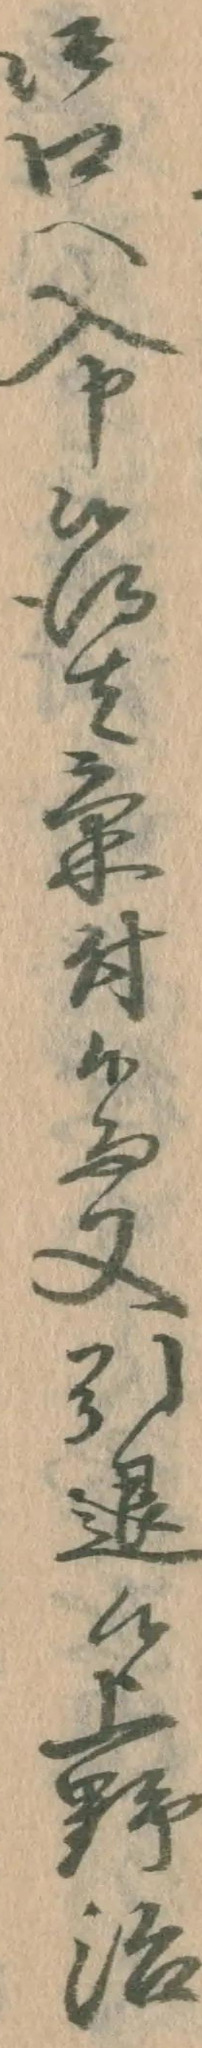御口へ入申候得者気付候而又引退候上野治
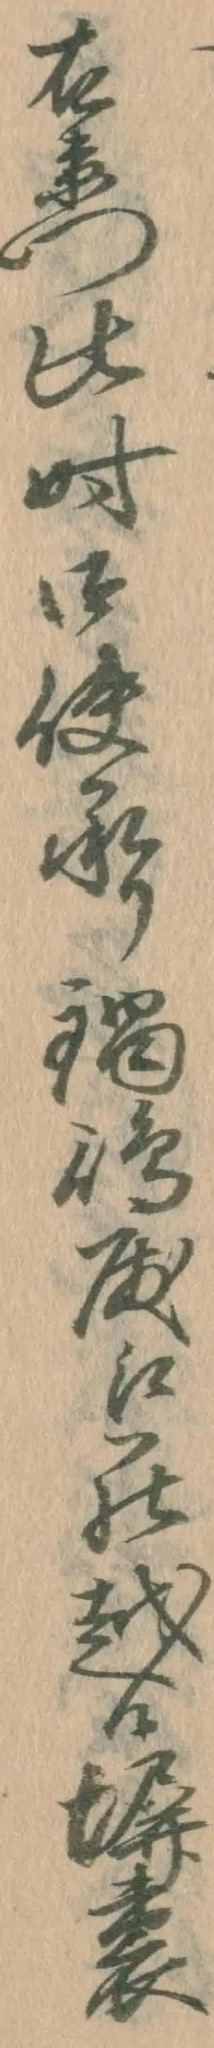右衛門此時御使承り鍋島殿江罷越候塀裏
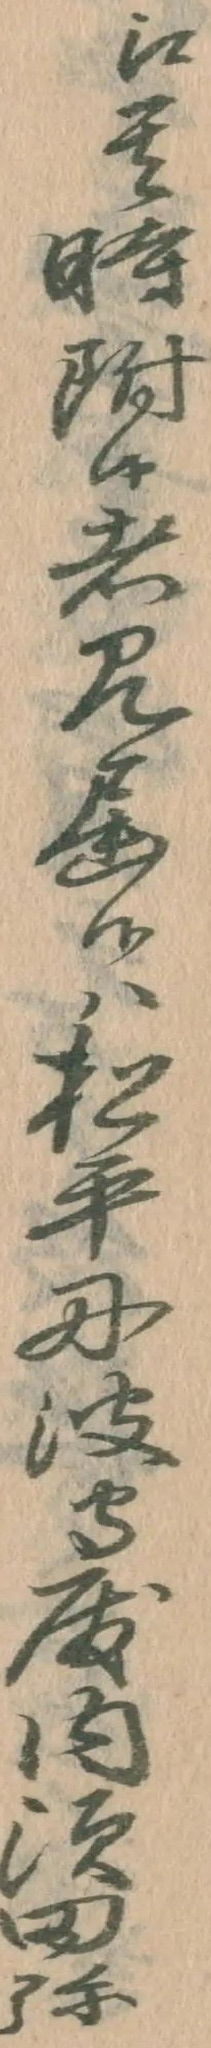江其時附候者見届候は松平丹波守殿内須田弥
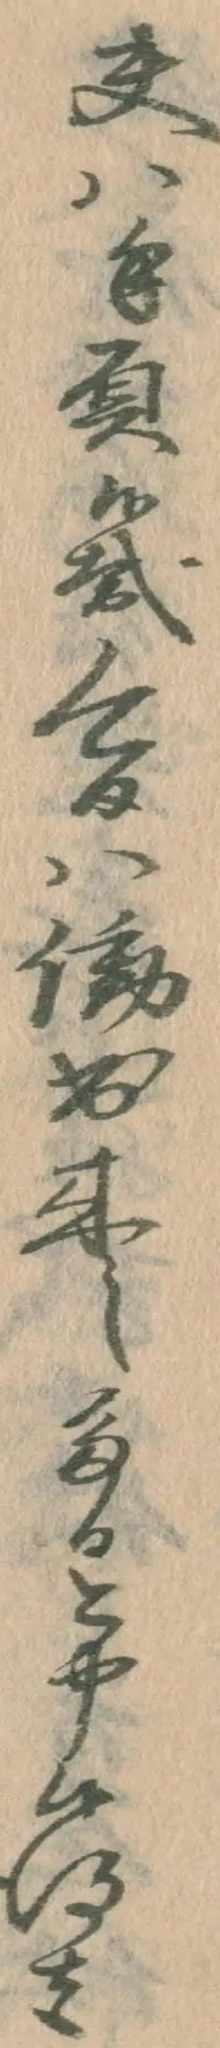夫は手負候哉今日は働出来し多ると申候得者
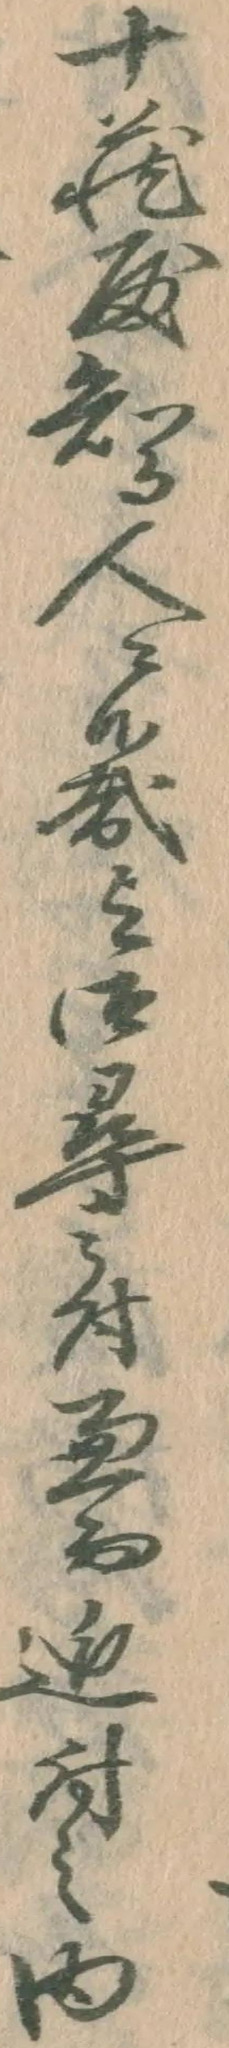十蔵殿知る人に候哉与御尋に付兼而追付之由
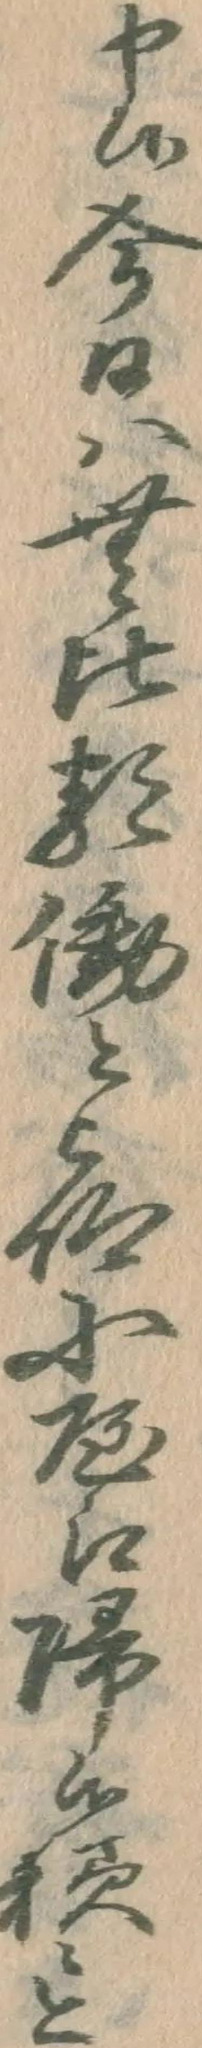申候今日は無比類働と被仰小屋江帰候様にと
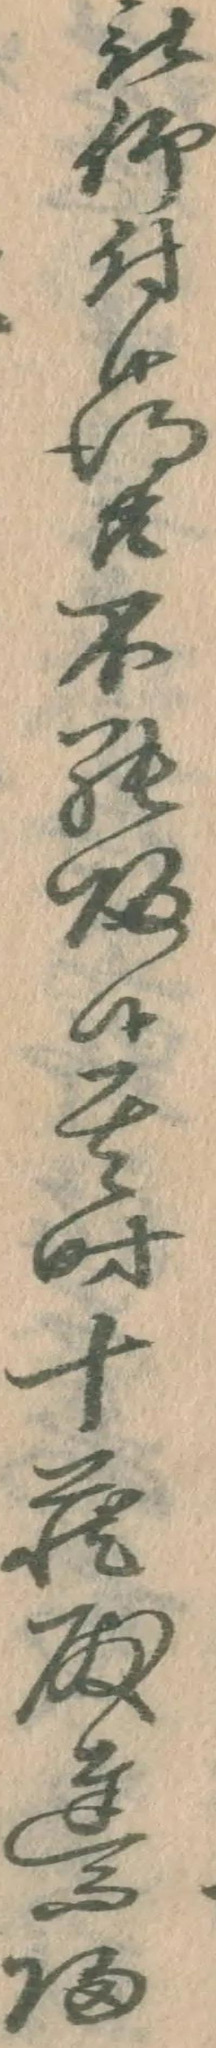被仰付候得共不罷皈候其時十蔵殿達而帰
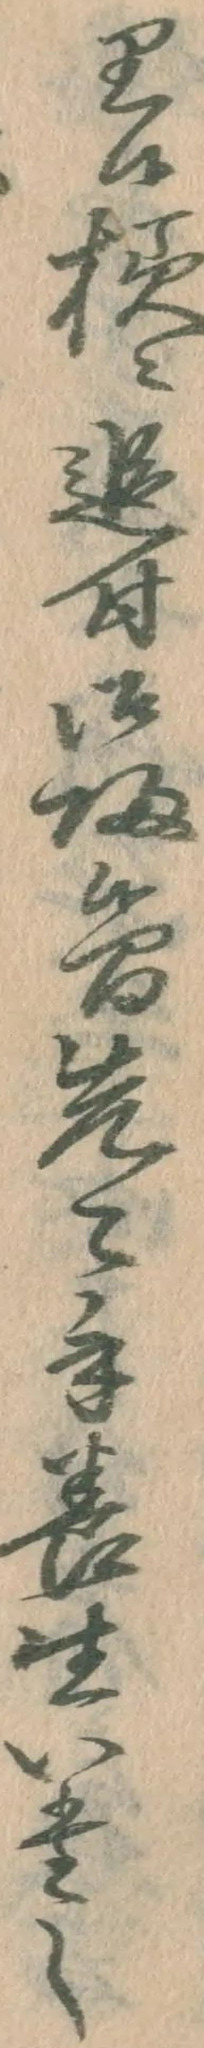里候様に追付御皈候間先々手養生い堂し
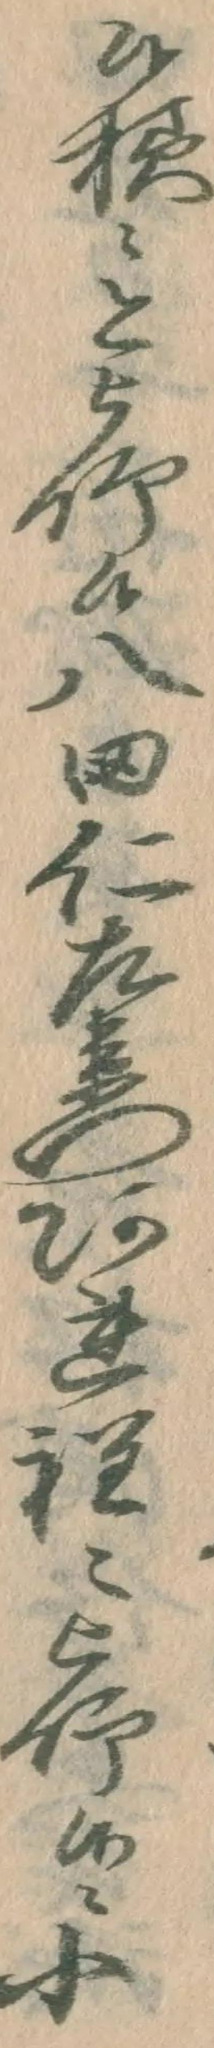候様にと被仰候八田仁左衛門阿連程に被仰候に小
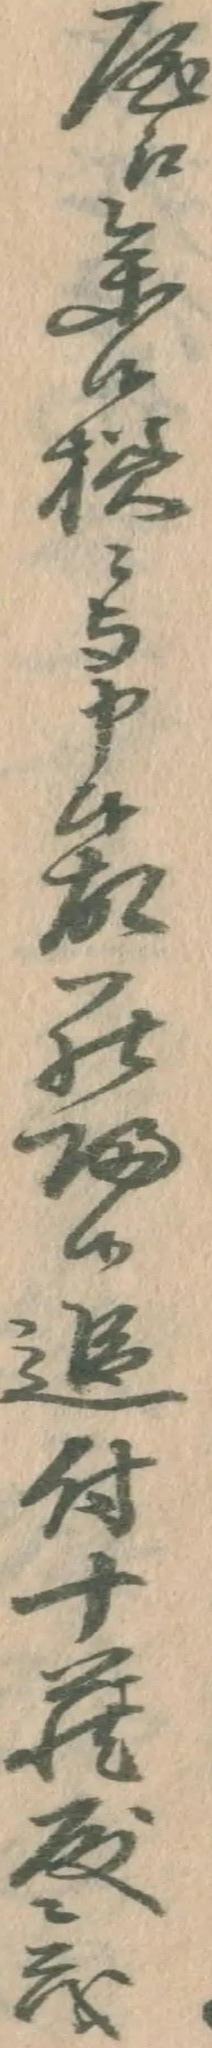屋江参候様に与申候故罷帰候追付十蔵殿に茂
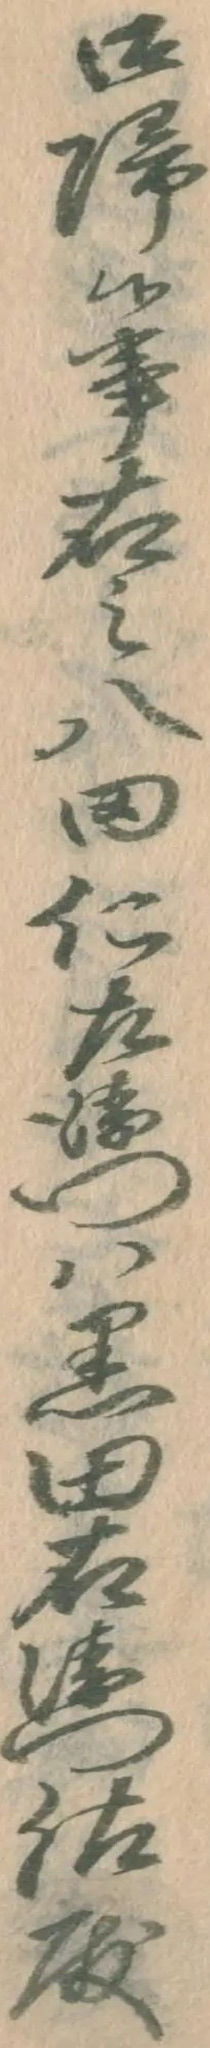御帰候事右之八田仁左衛門は黒田右衛門佐殿

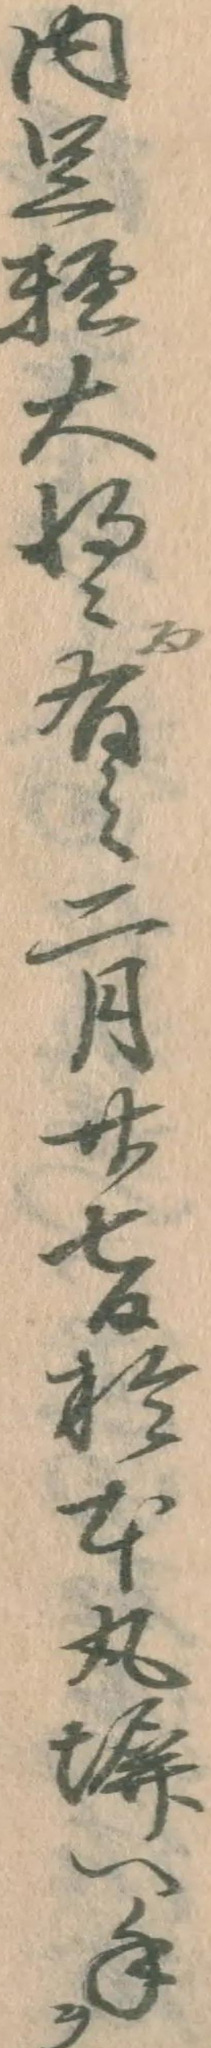内足軽大将に而有之二月廿七日於本丸塀へ手を
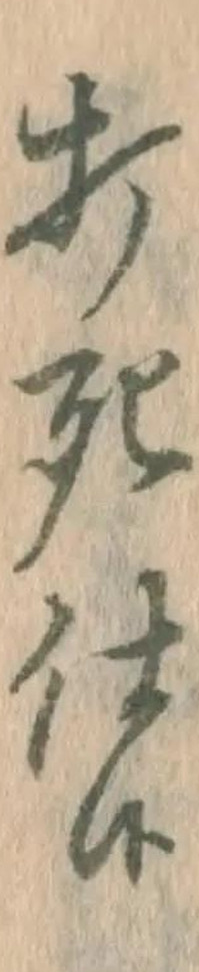打死仕候
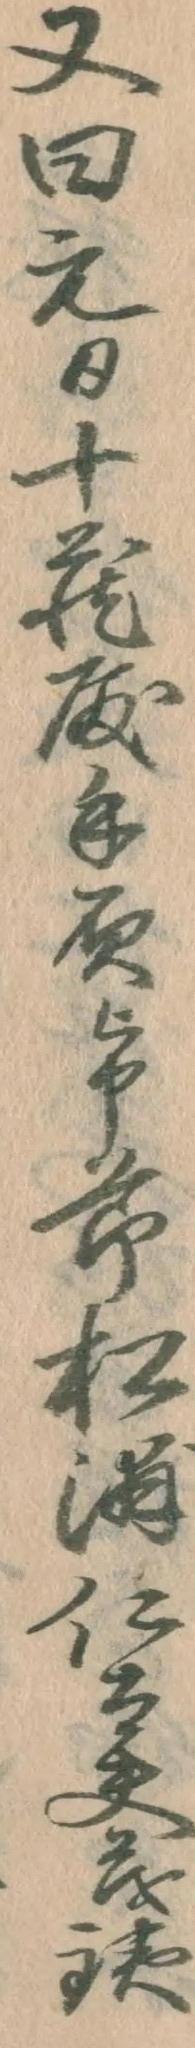又曰元日十蔵殿手負被申節松浦仁太夫茂鉄
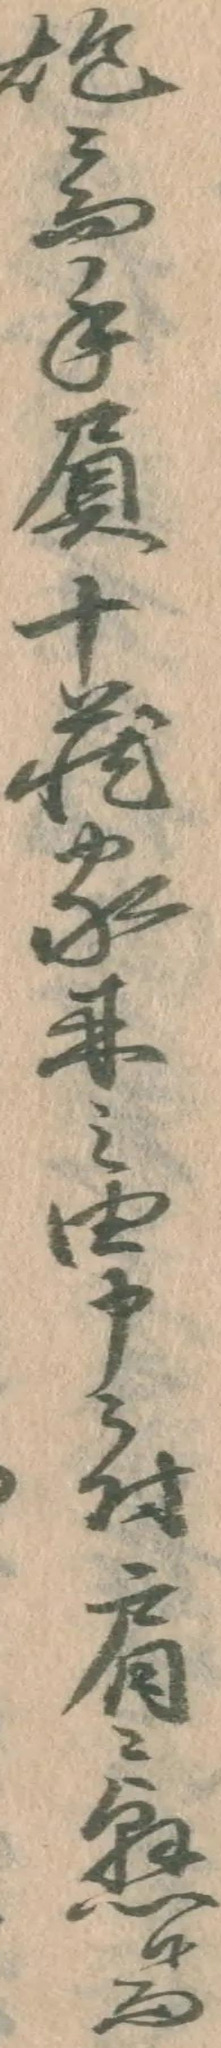炮に而手負十蔵家来之由申に付肩に懸候而
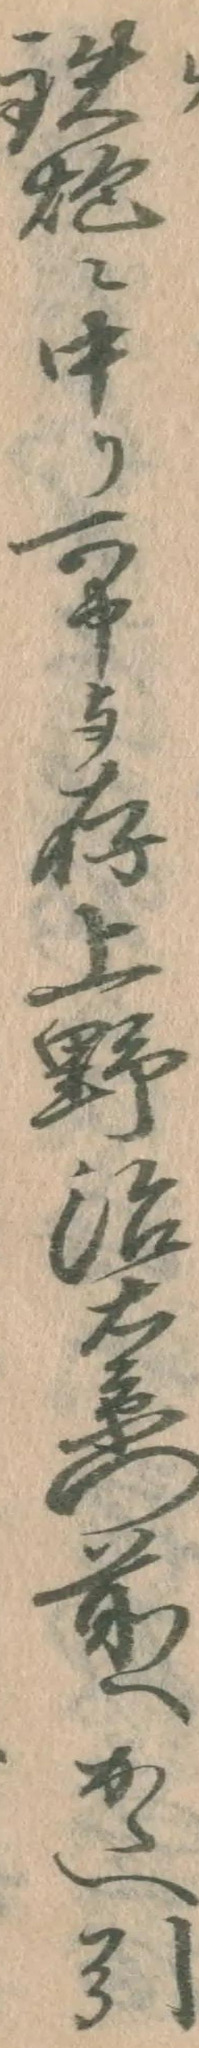鉄炮に中り可申与存上野治右衛門前へかゝへ引
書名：切支丹御退治記 49巻. [5]
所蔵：国立国会図書館 National Diet Library, JAPAN
